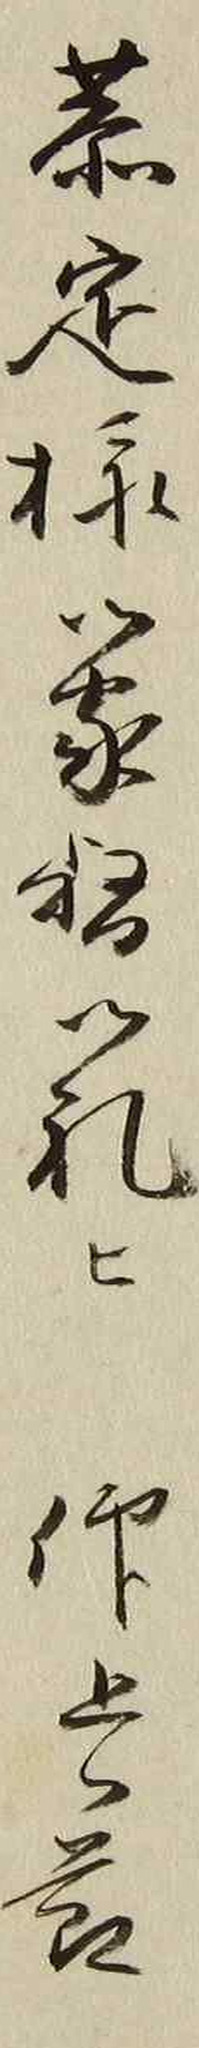恭定様御家督御礼被仰上候節
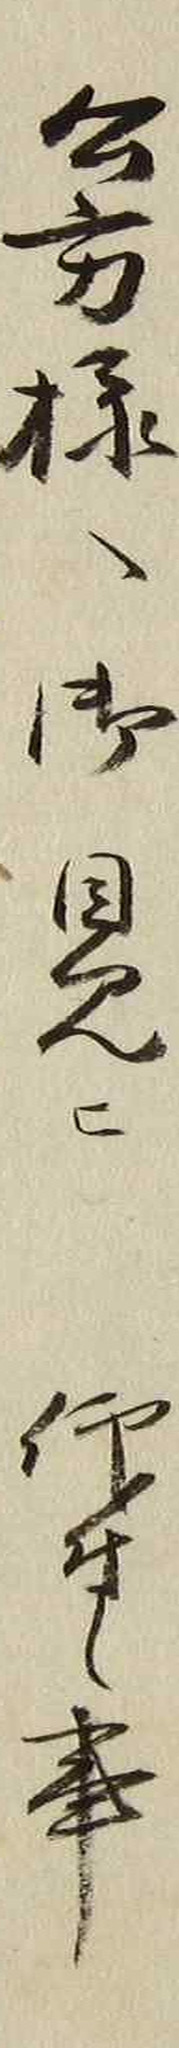公方様へ御目見被仰付候事
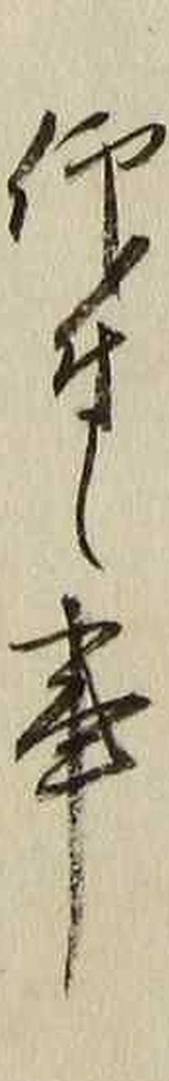仰付候事
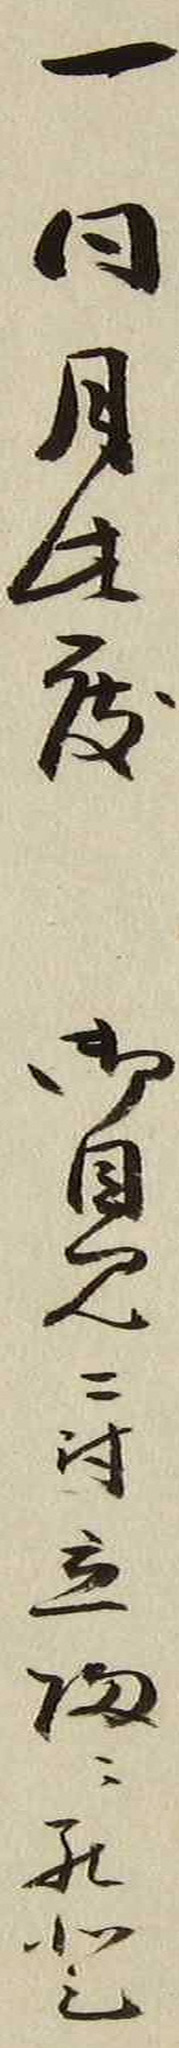一同月此度御目見に付立帰に罷登
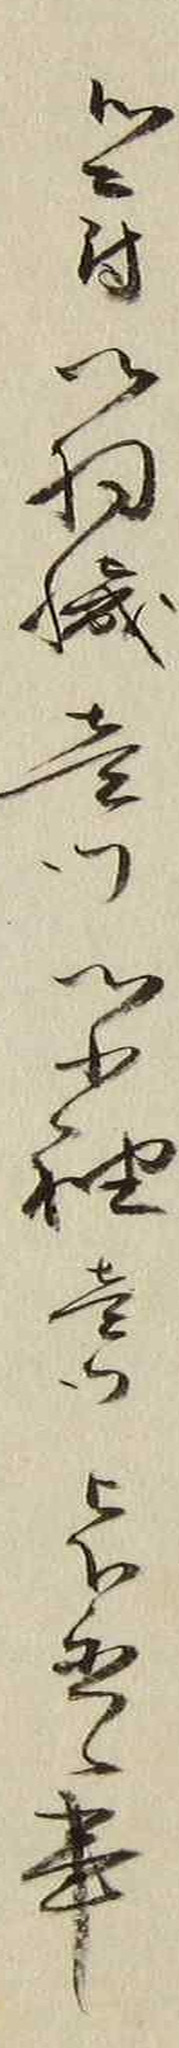候に付御羽織壱つ御小袖壱つ被下置候事
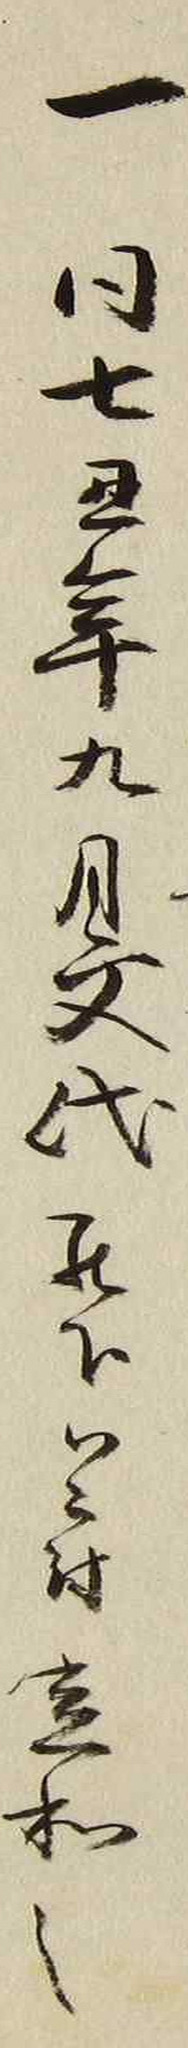一同七丑年九月交代罷下候に付定和之
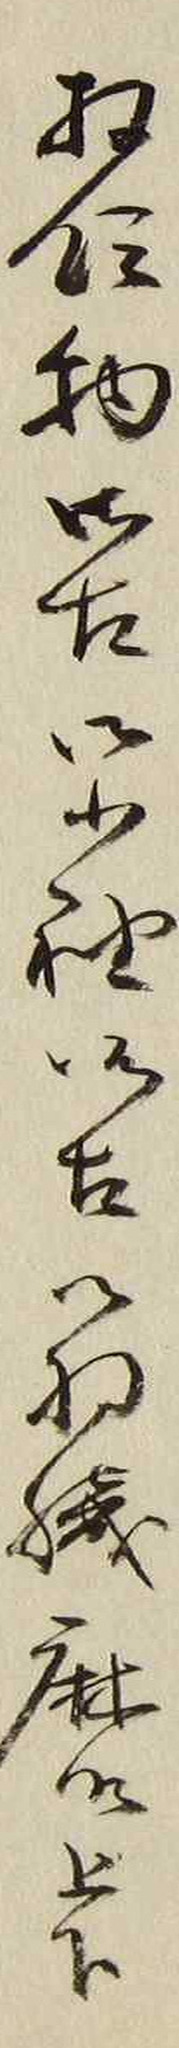拝領物御古御小袖御古御羽織麻御上下
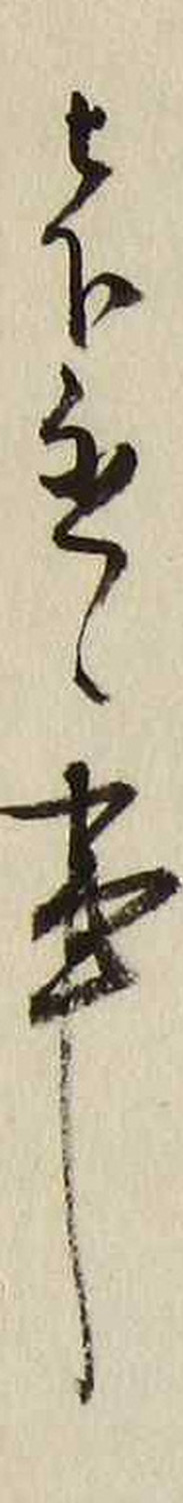被下置候事
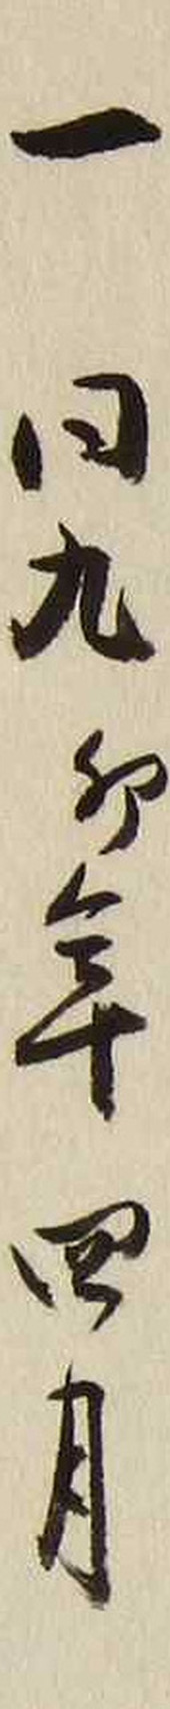一同九卯年四月

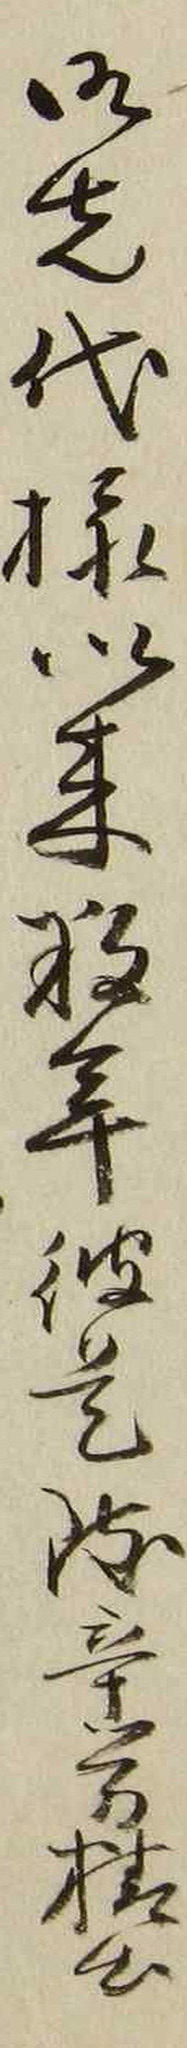御先代様以来枚年彼是致辛労精出
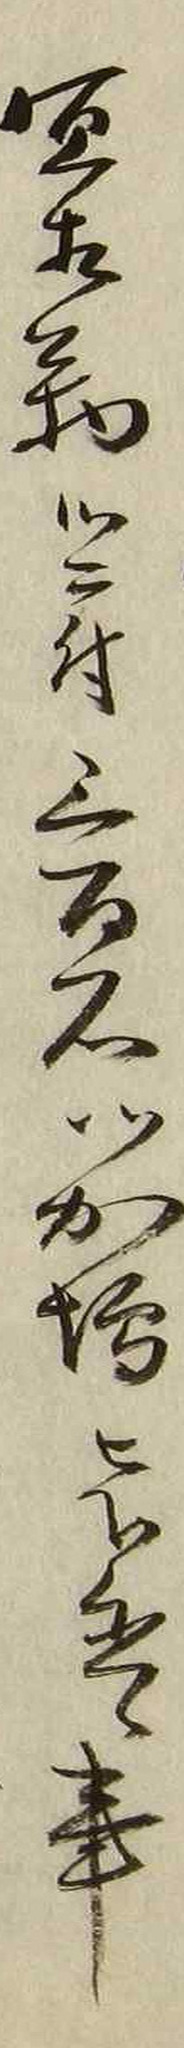宜相勤候に付三百石御加増被下置候事
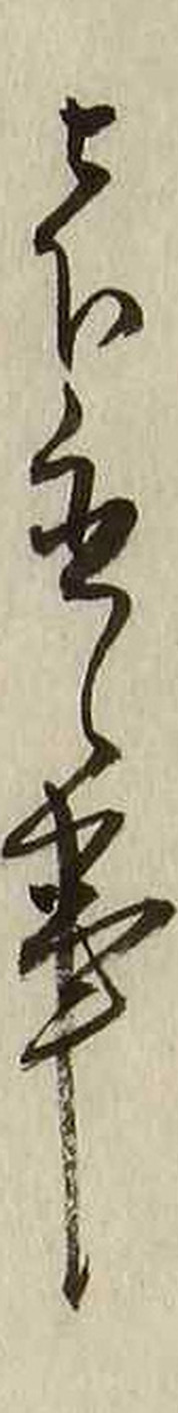被下置候事
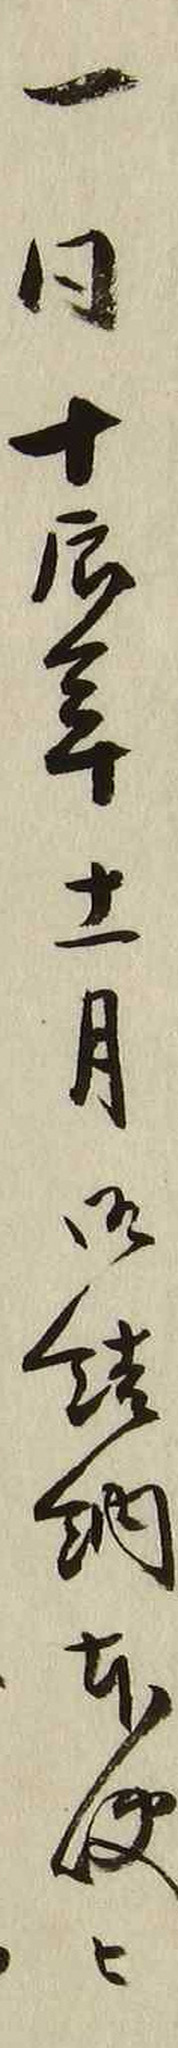一同十辰年十一月御結納本使被
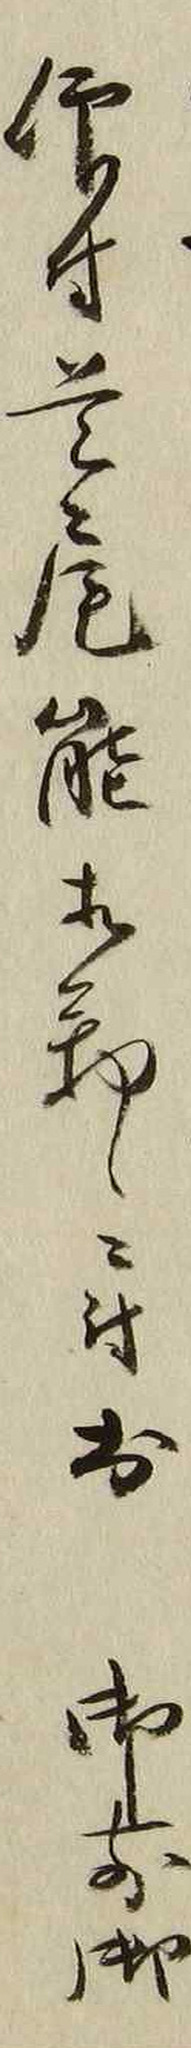仰付首尾能相勤候に付於御前御
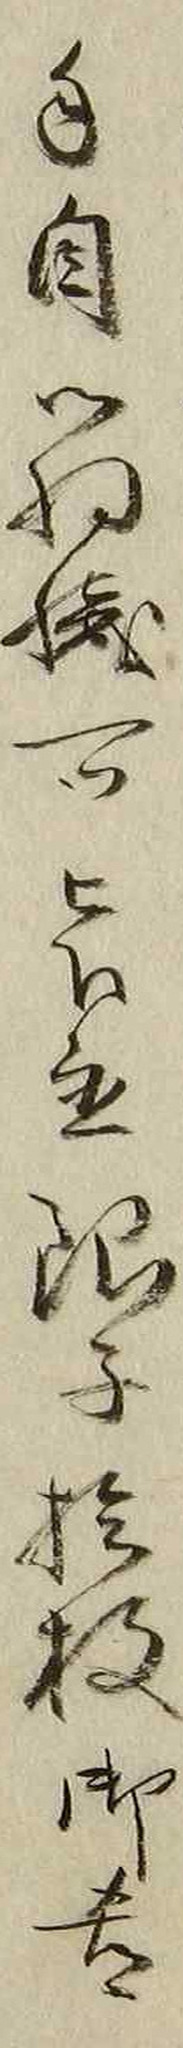手自御羽織一つ被下置銀子拾枚御肴
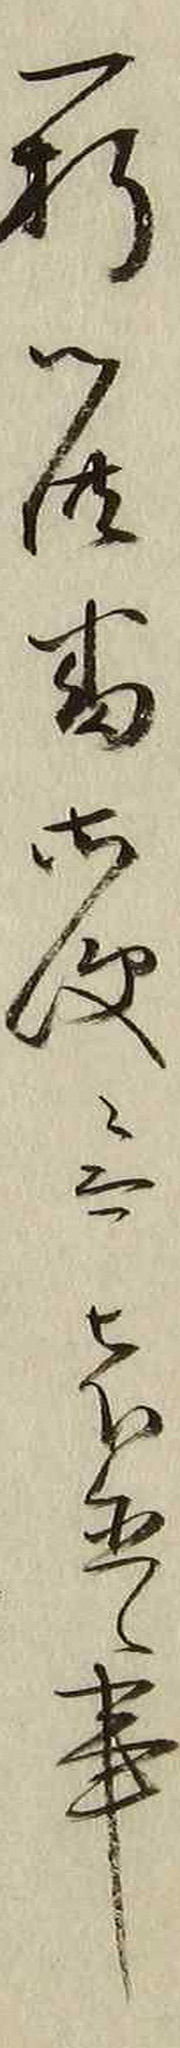一折御供番御使に而被下置候事
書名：諸士系譜　巻之292　き之部1
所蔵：会津若松市立会津図書館
